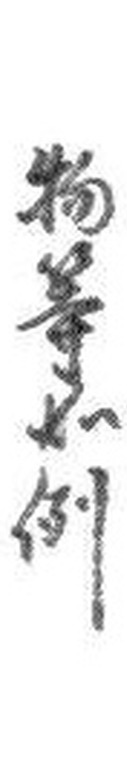物等如例

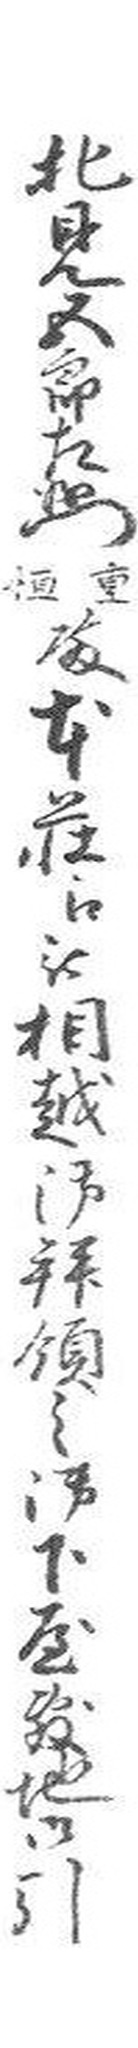北見五郎左衛門重恒殿本荘江相越御拝領之御下屋敷地御引
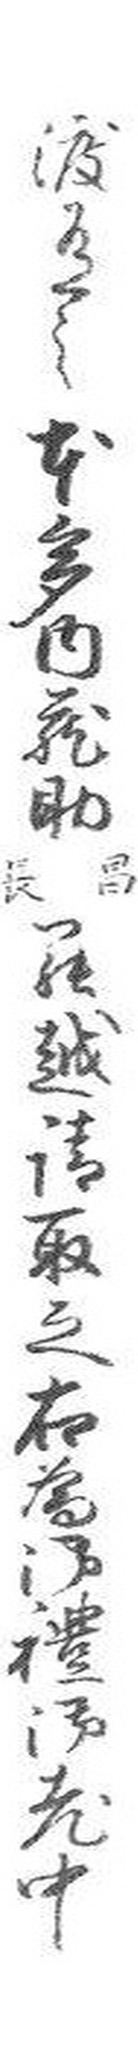渡有之本多内蔵助昌長罷越請取之右為御礼御老中
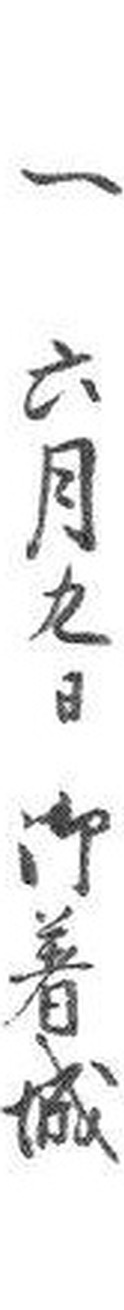一六月九日御着城
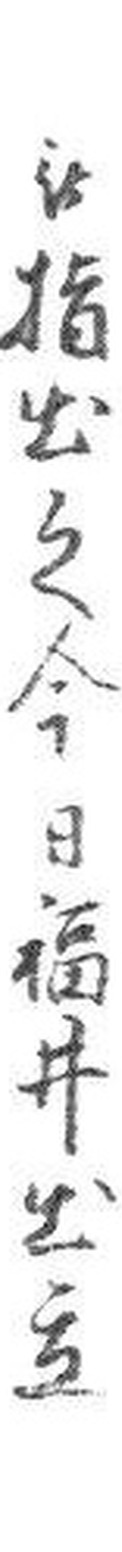被指出之今日福井出立
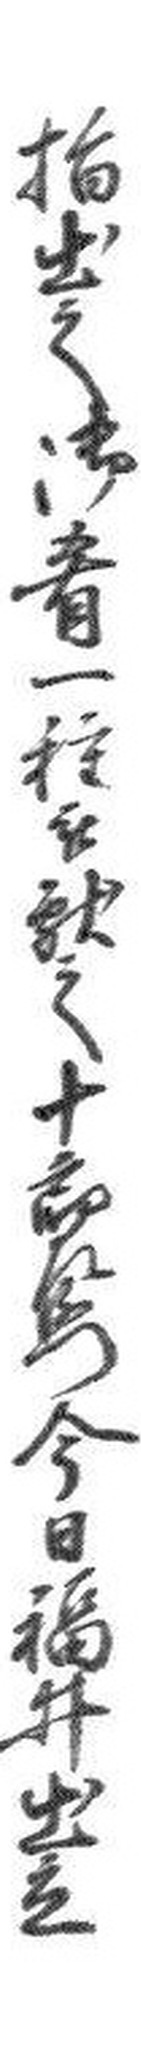指出之御肴一種被献之十郎左衛門今日福井出立
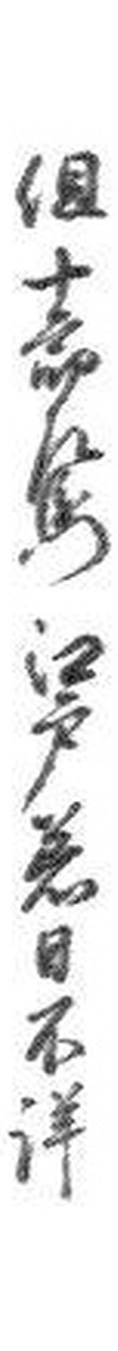但十郎左衛門江戸着不詳
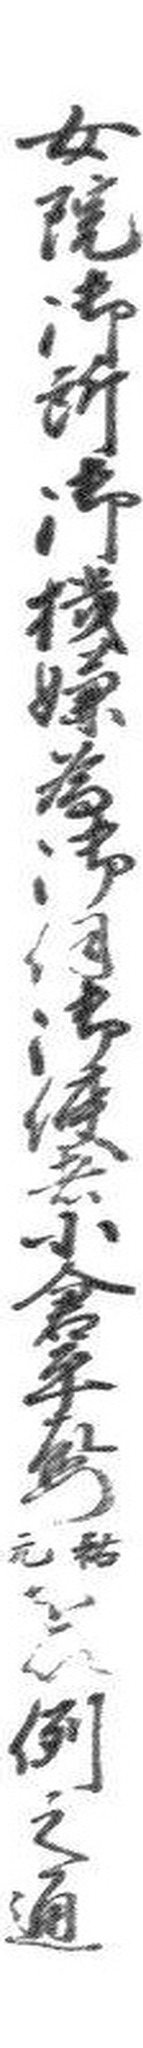女院御所御機嫌為御伺御使者小倉平左衛門祐元を以例之通
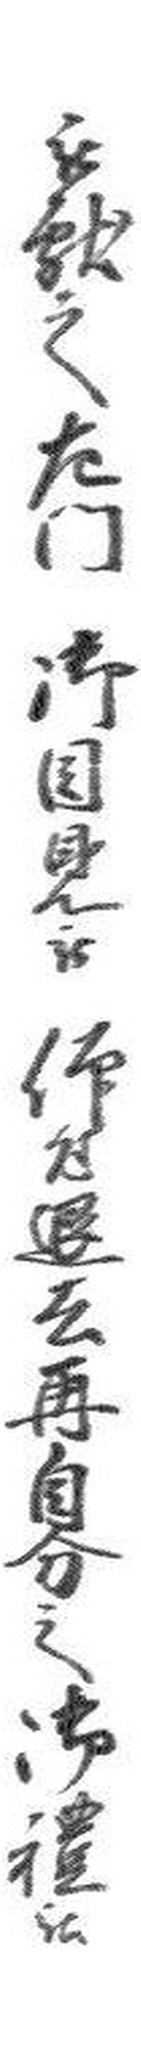被献之左門御目見被仰付退去再自分之御礼被
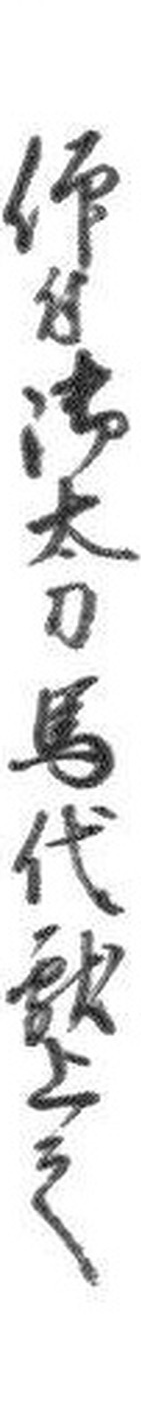仰付御太刀馬代献上之

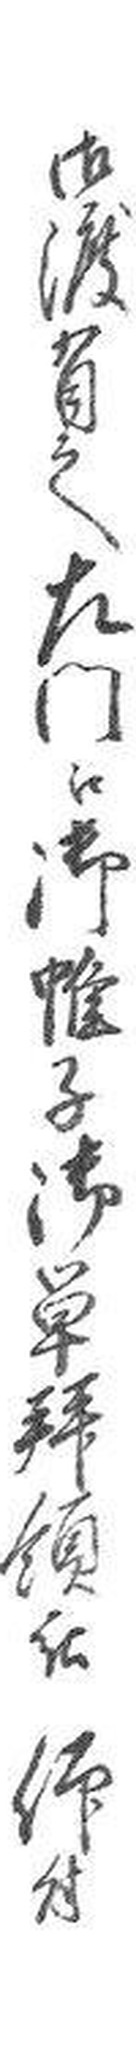御渡有之左門江御帷子御単拝領被仰付
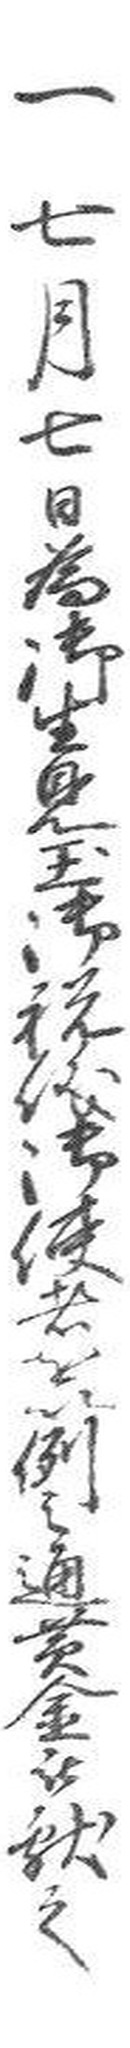一七月七日為御生見玉御祝儀御使者を以例之通黄金被献之
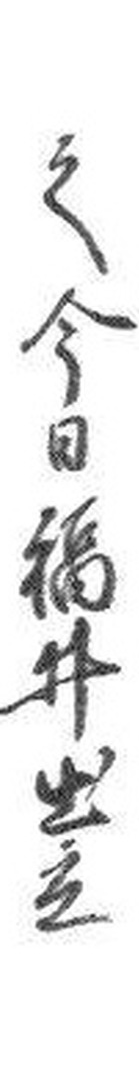之今日福井出立
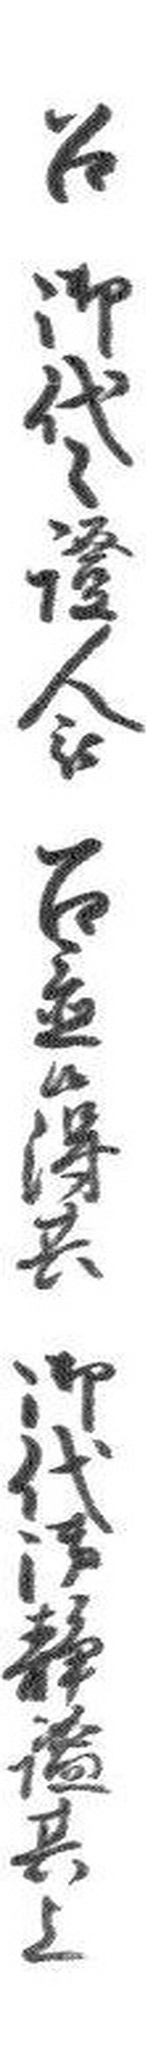召御代々証人被召置候得共御代御静謐其上
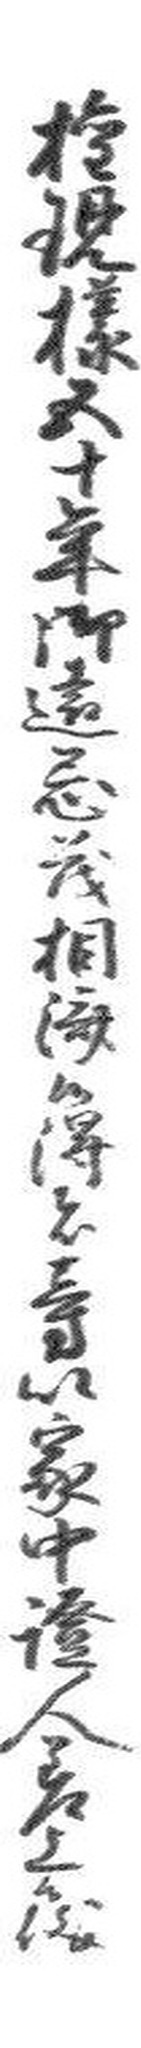権現様五十年御遠忌茂相済候得者寺以家中証人差上候儀
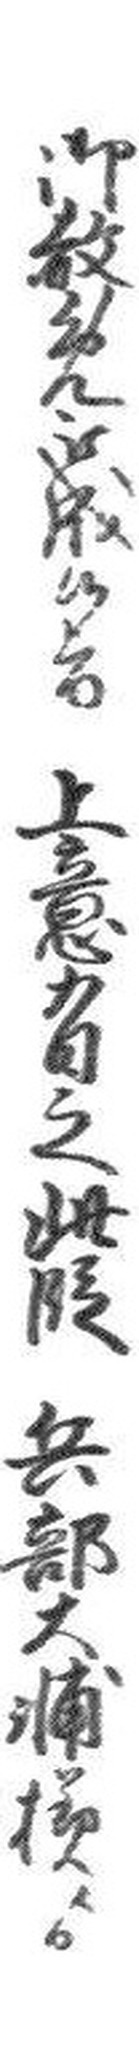御赦免被成候旨上意有之此段兵部大輔様ニ而
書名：家譜 七 光通公 従寛文四年到同九年
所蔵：福井県文書館 Fukui Prefectural Archives
